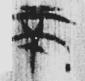不
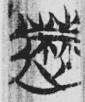速
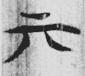亓
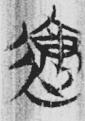○（就）
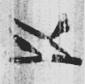之
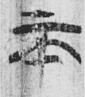不
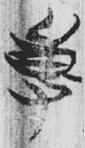專（附）
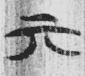亓
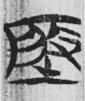○（啓）
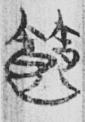節
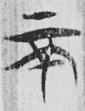不
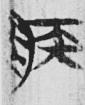疾
